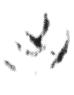出
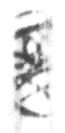婁
